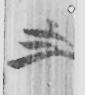之
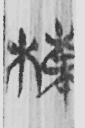棟
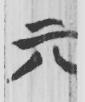亓
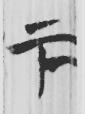下
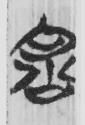{余口}（余）
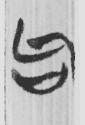句
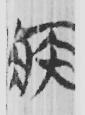疾
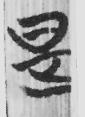是
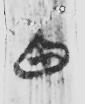囟
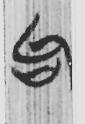句
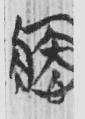{疾心}
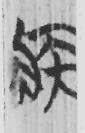疾
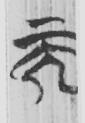而
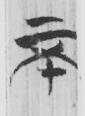不
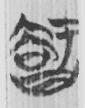智
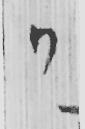人
